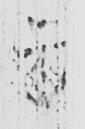百
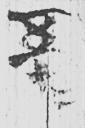五十=
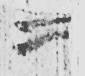二
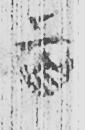百
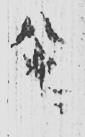八十=
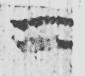二
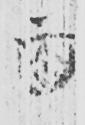百
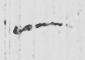一
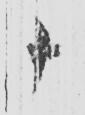十
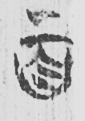百
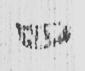四
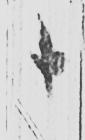十
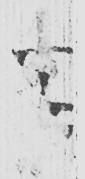七十=
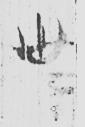卅=
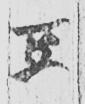五
